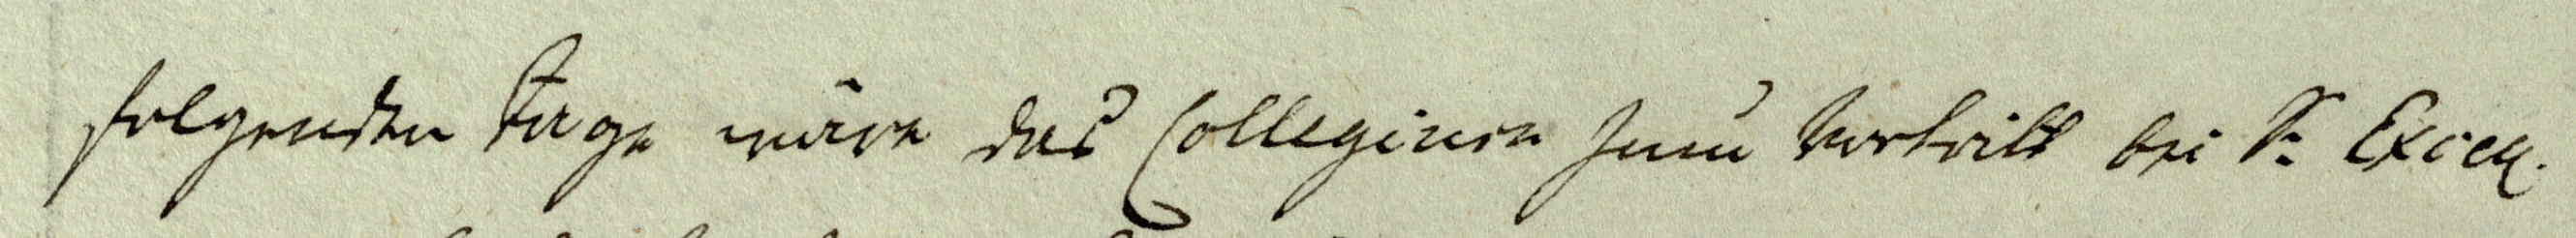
folgenden Tage wäre das Collegium zum Vortritt bei Sr. Excel.
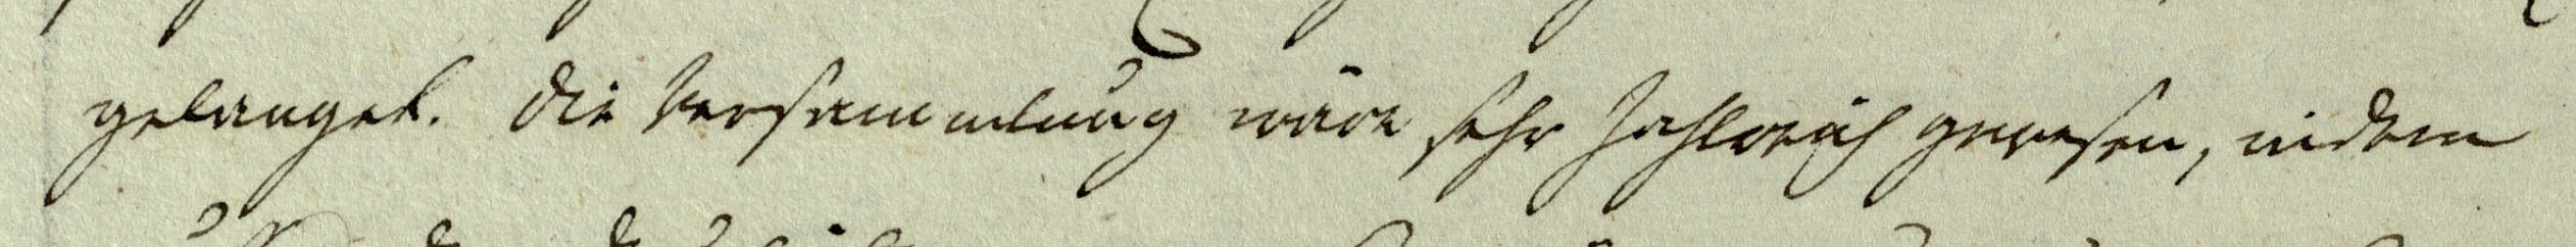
gelanget. Die Versammlung wäre sehr zahlreich gewesen, indem
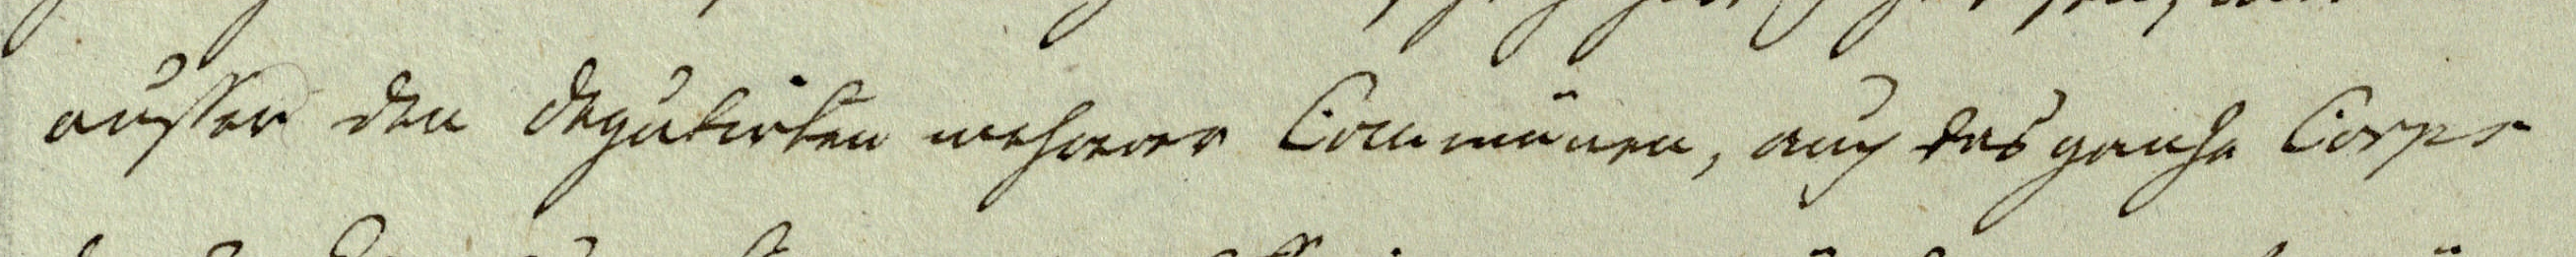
ausser den Deputirten mehrerer Commünen, auch das ganze Corps
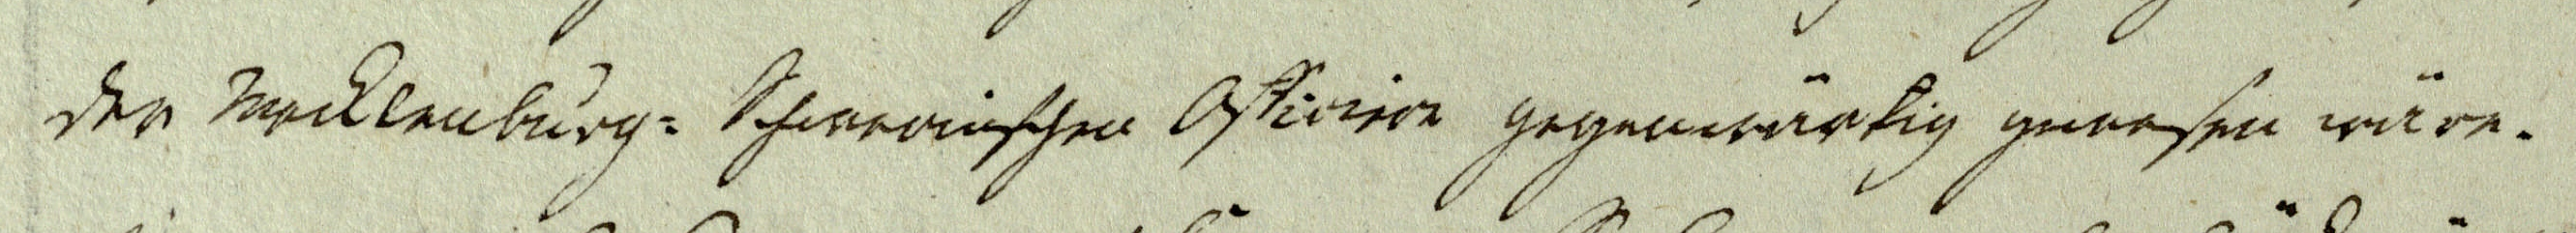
der Mecklenburg-Schwerinschen Officiere gegenwärtig gewesen wäre.
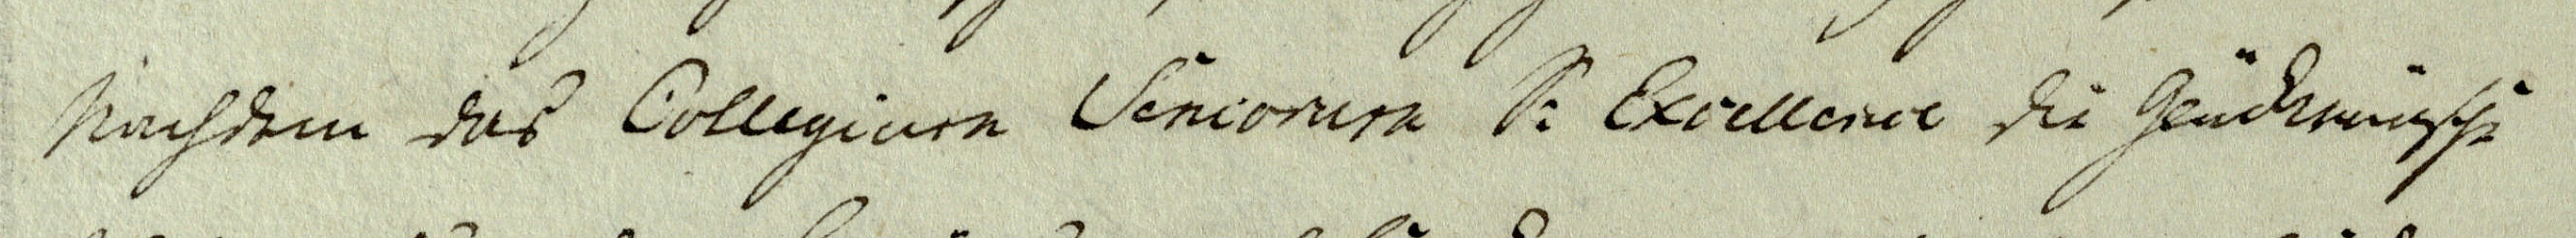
Nachdem das Collegium Seniorum Sr Excellence die Glückwünsche
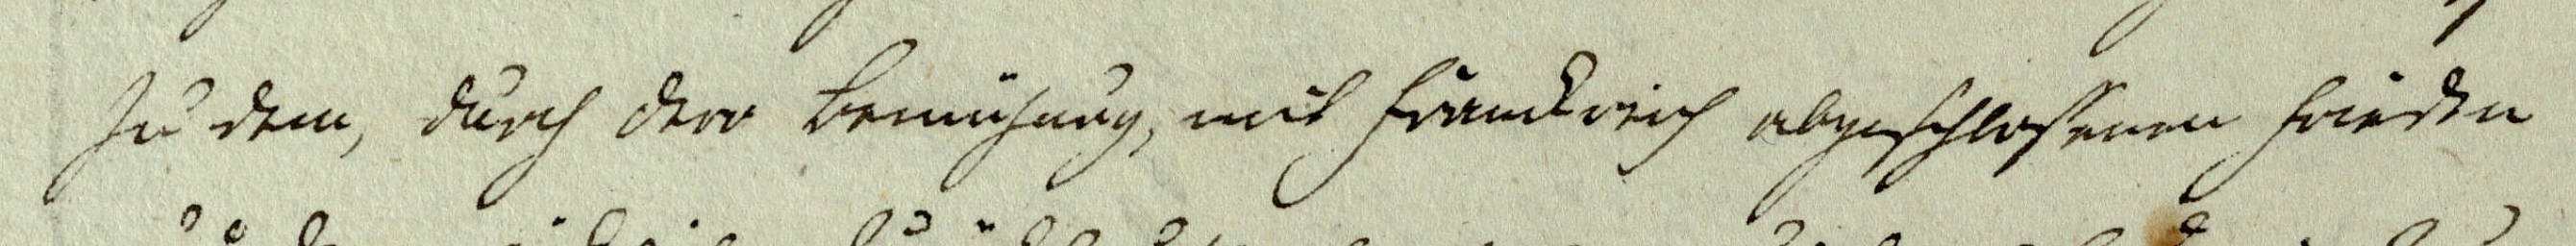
zu dem, durch dero Bemühung, mit Franckreich abgeschlossenen Frieden
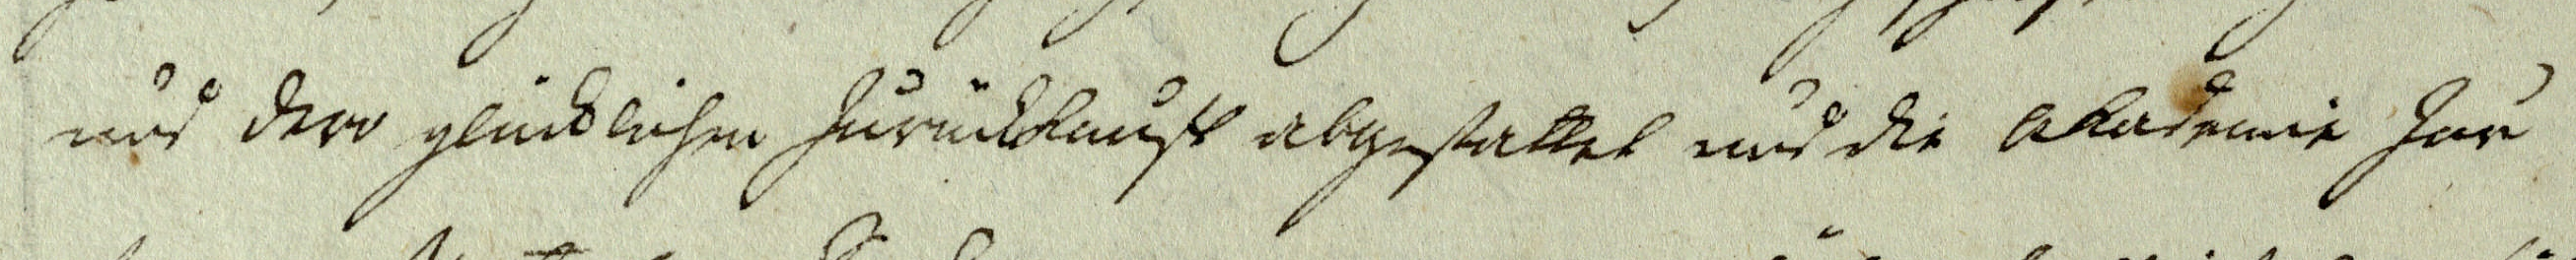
und der glücklichen Zurückkunft abgestattet und die Akademie zur
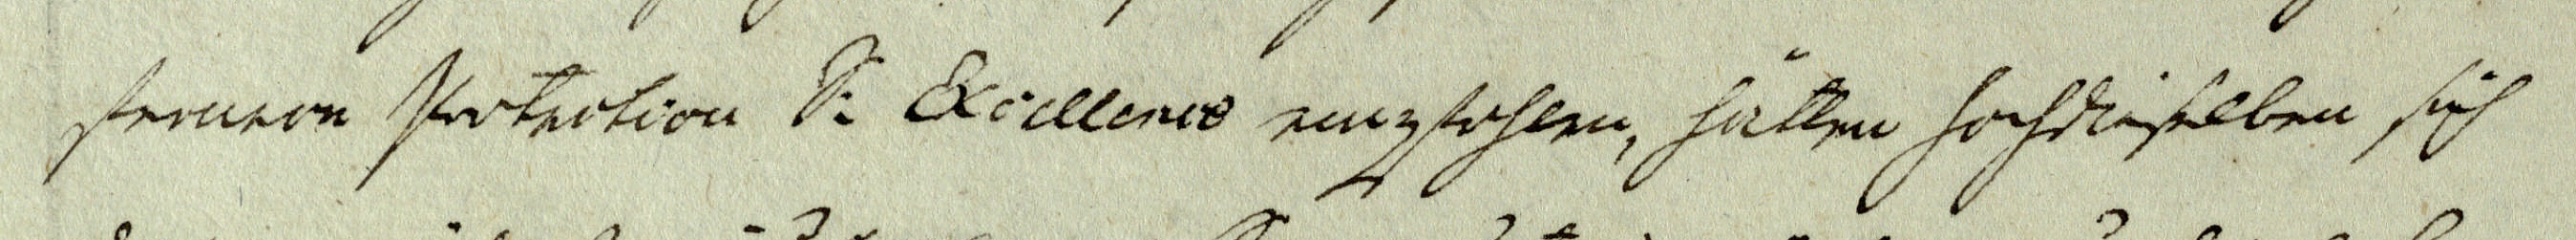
fernern Protection Sr. Excellence empfohlen, hätten Hochdieselben sich
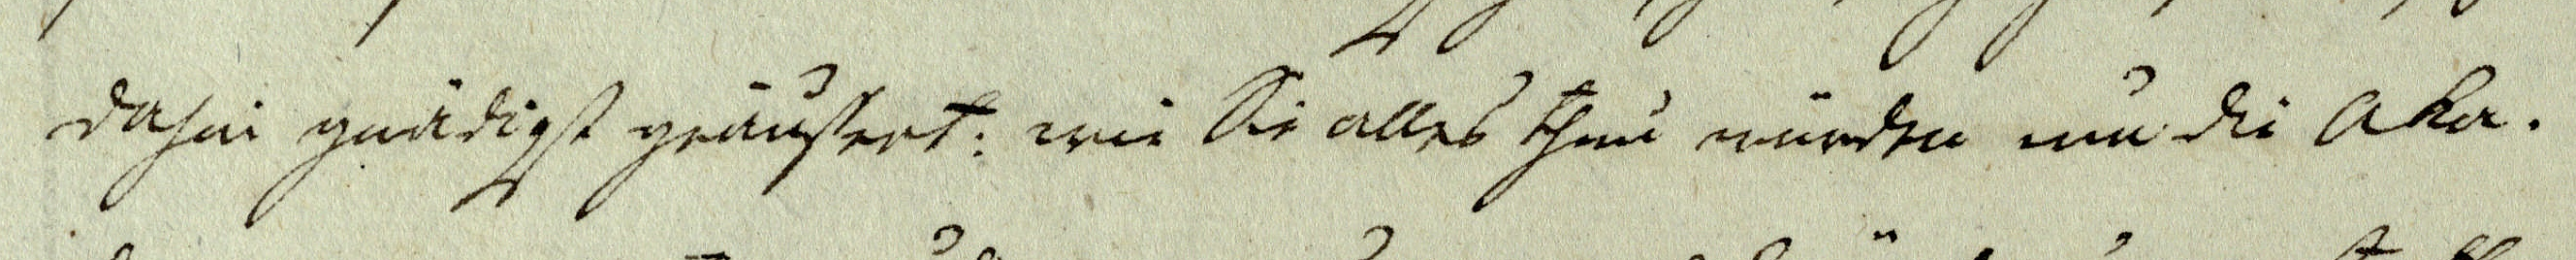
dahin gnädigst geäussert: wie Sie alles thun würden um die Aka¬
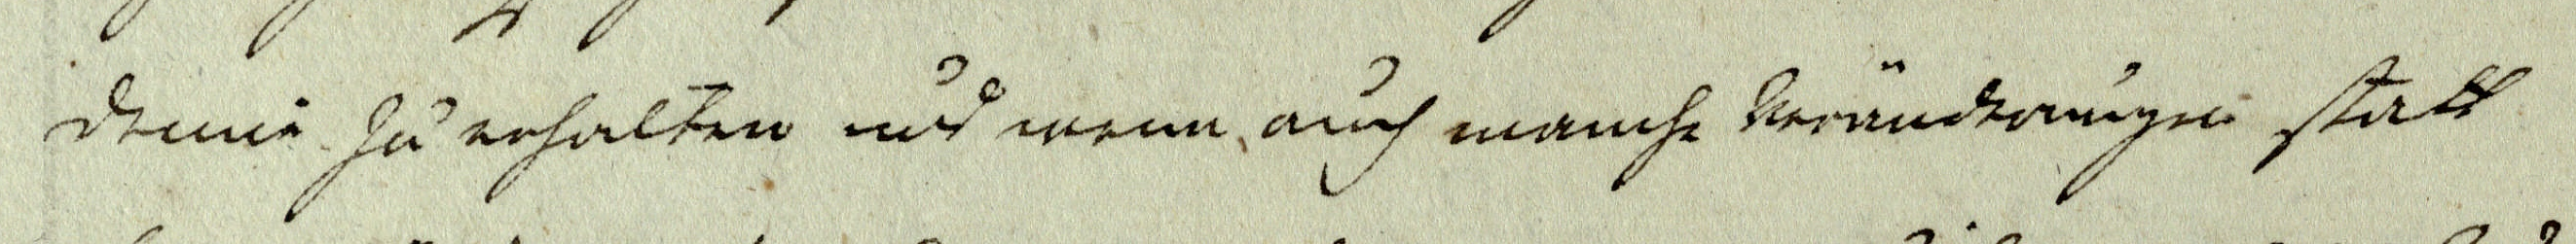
demie zu erhalten und wenn auch manche Veränderungen statt
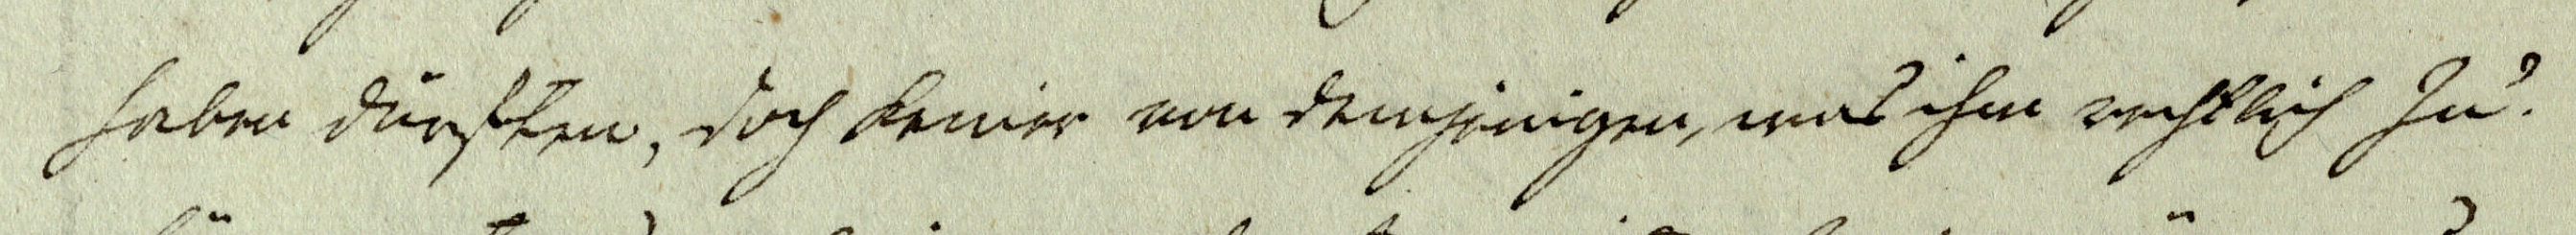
haben dürften, doch keiner von demjenigen, was ihm rechtlich zu¬
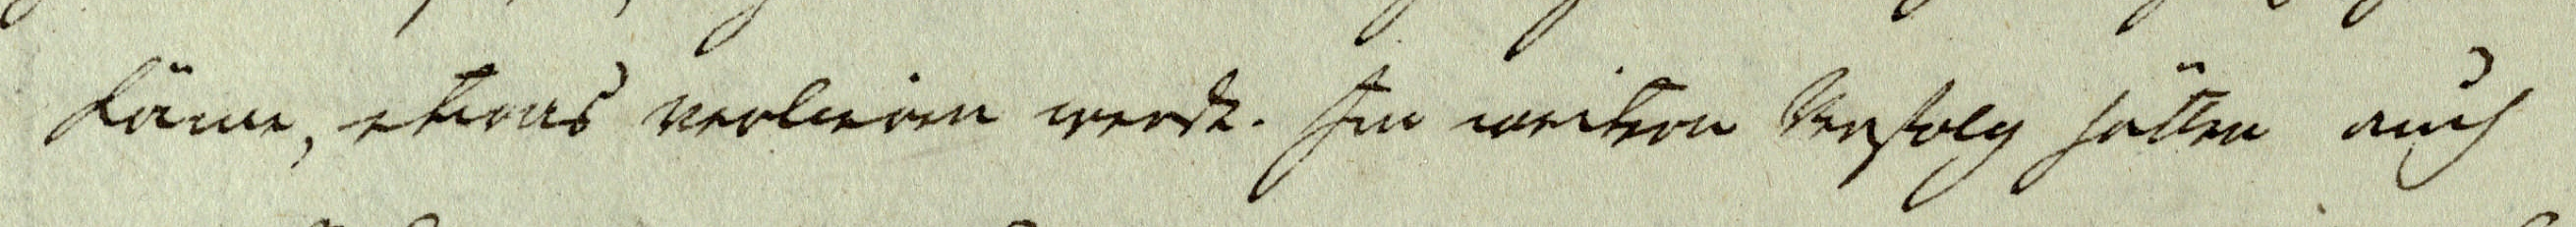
käme, etwas verlieren werde. Im weitern Verfolg hätten auch
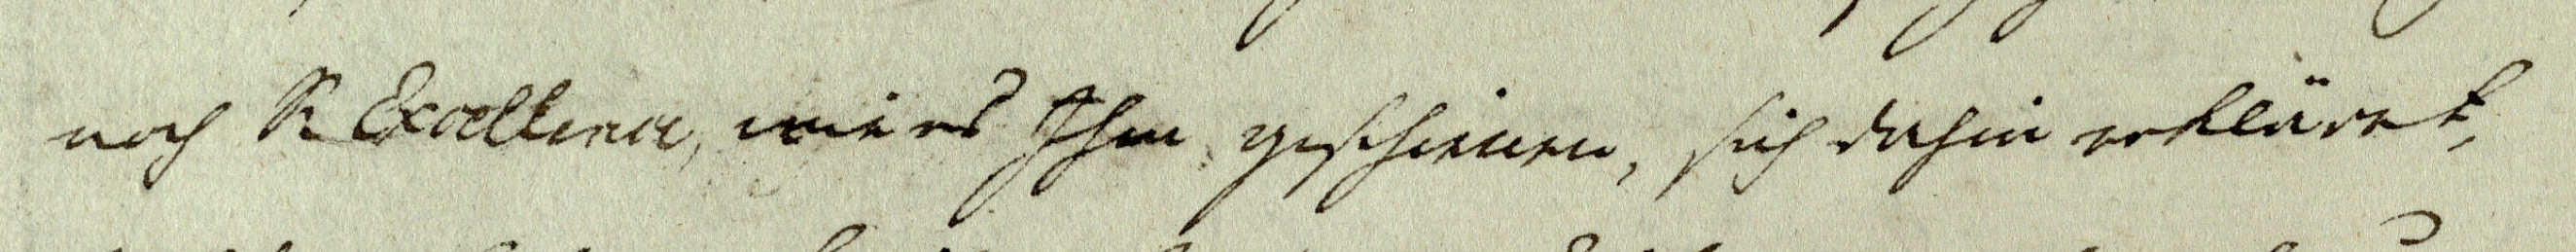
noch Sr Excellence, wie es Ihm, geschienen, sich dahin erkläret
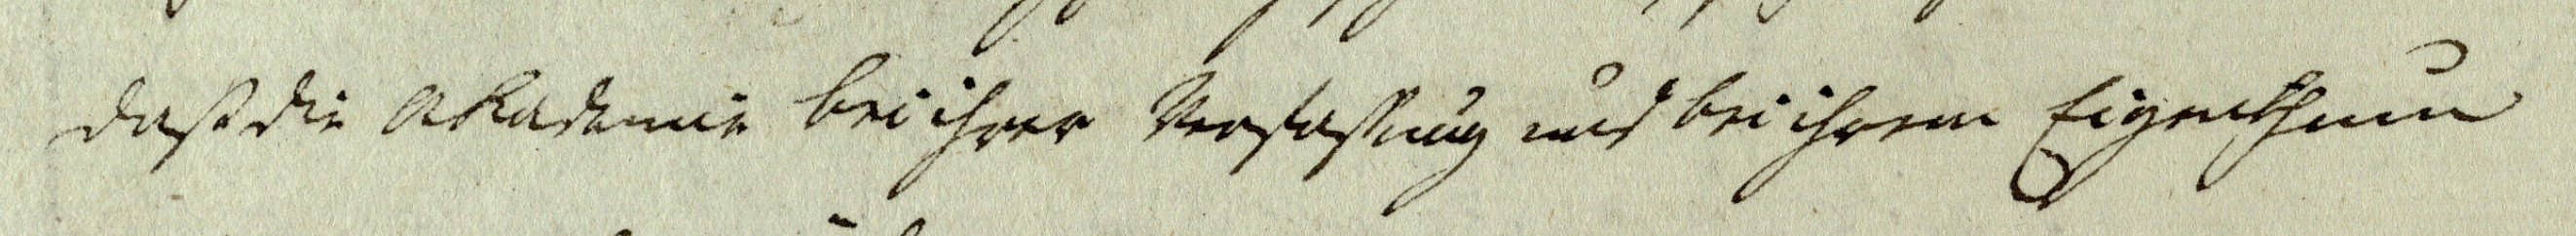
daß die Akademie bei ihrer Verfassung und bei ihrem Eigenthum
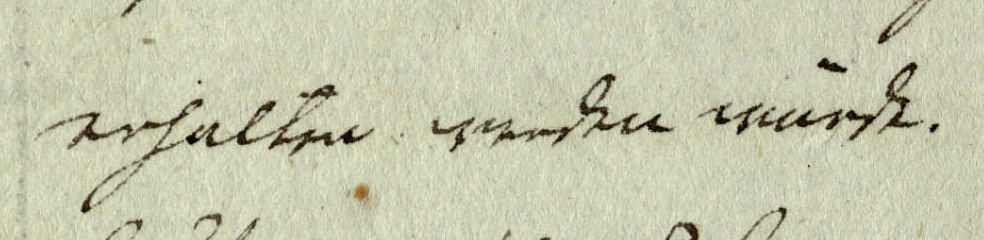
erhalten, werden würde.
